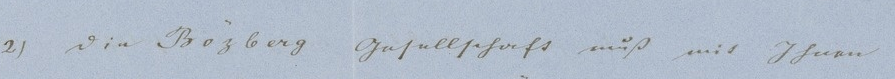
2) Die Bözberg Gesellschaft muß mit Ihnen
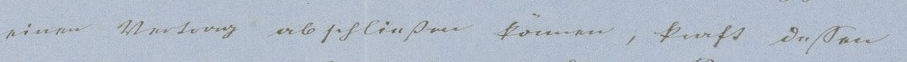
einen Vertrag abschließen können, kraft dessen
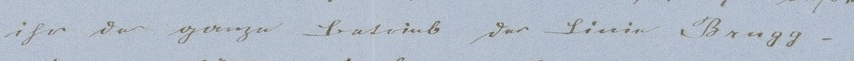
Ihr der ganze Betrieb der Linie Brugg–
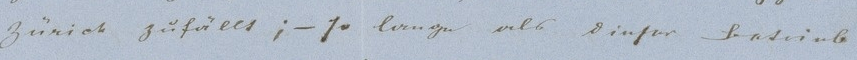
Zürich zufällt; – so lange als dieser Betrieb
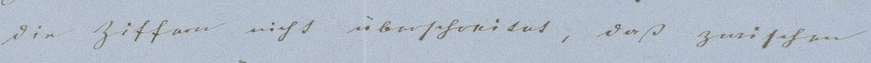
die Ziffern nicht überschreitet, daß zwischen
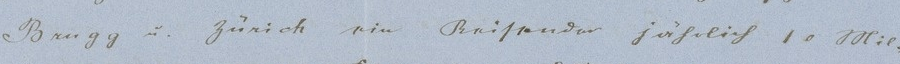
Brugg u. Zürich ein Reisender jährlich 10 Mil-
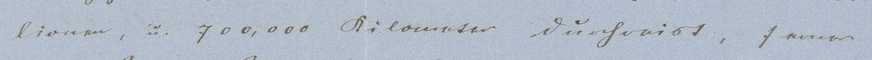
lionen, u. 700,000 Kilometer durchreist, ferner
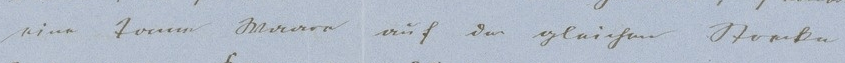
eine Tonne Waare auf der gleichen Strecke
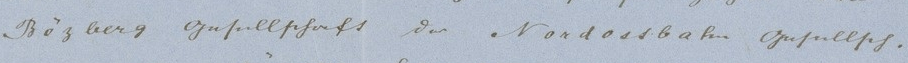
Bözberg Gesellschaft der Nordostbahn Gesellsch.
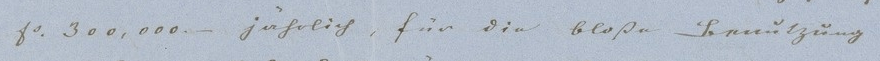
fs 300,000.– jährlich, für die bloße Benutzung
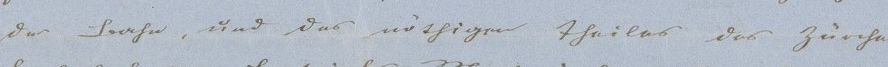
der Bahn, und des nöthigen Theiles des Zürcher
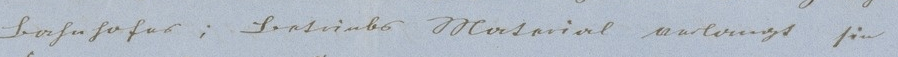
Bahnhofes; Betriebs Material verlangt sie
